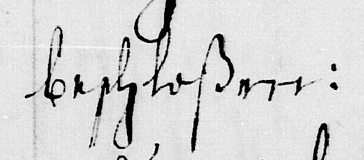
beschloßen:
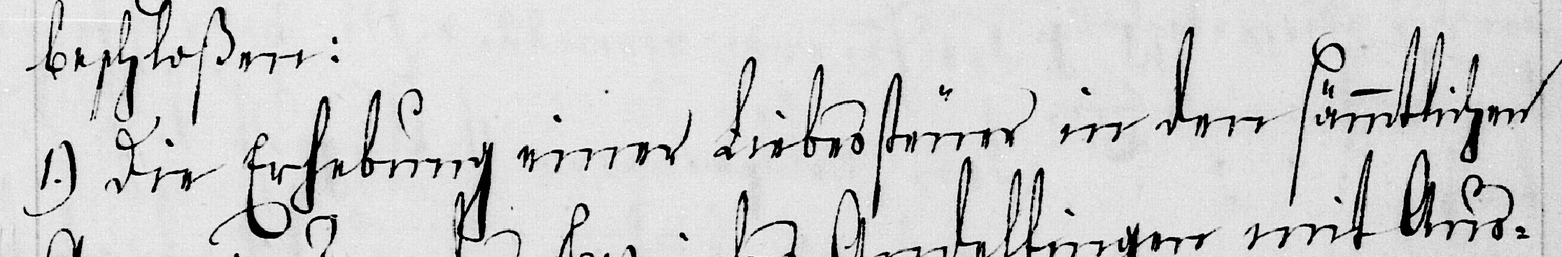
1.) Die Erhebung einer Liebessteuer in den sämmtlichen
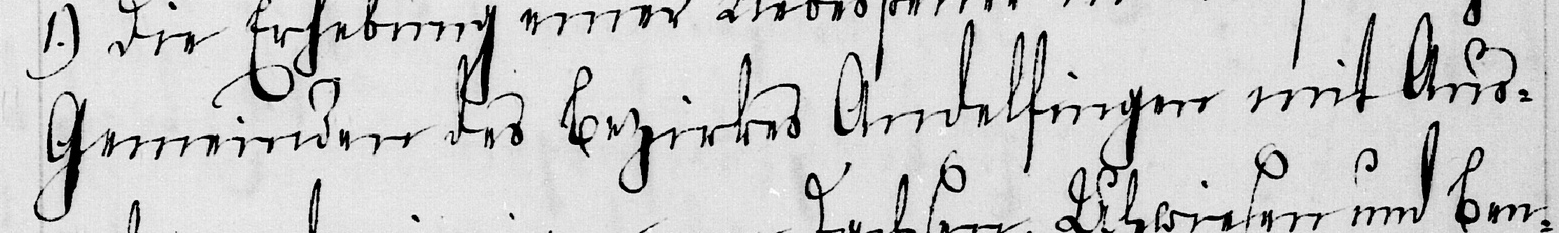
Gemeinden des Bezirkes Andelfingen mit Aus¬
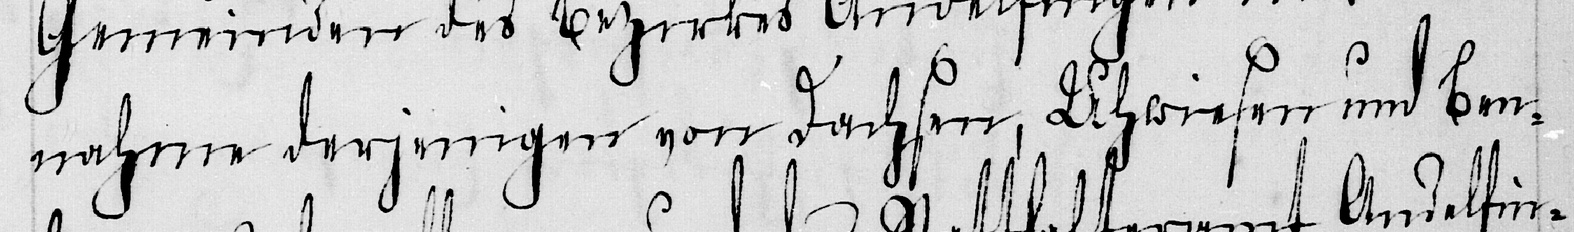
nahme derjenigen von Dachsen, Uhwiesen und Ben¬
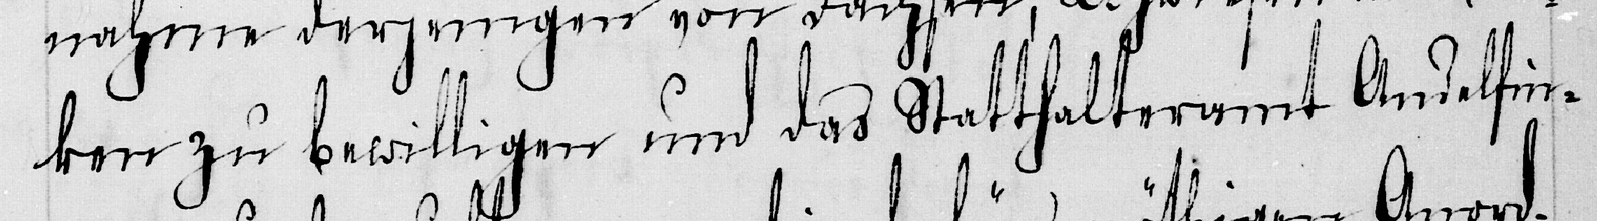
ken zu bewilligen und das Statthalteramt Andelfin¬
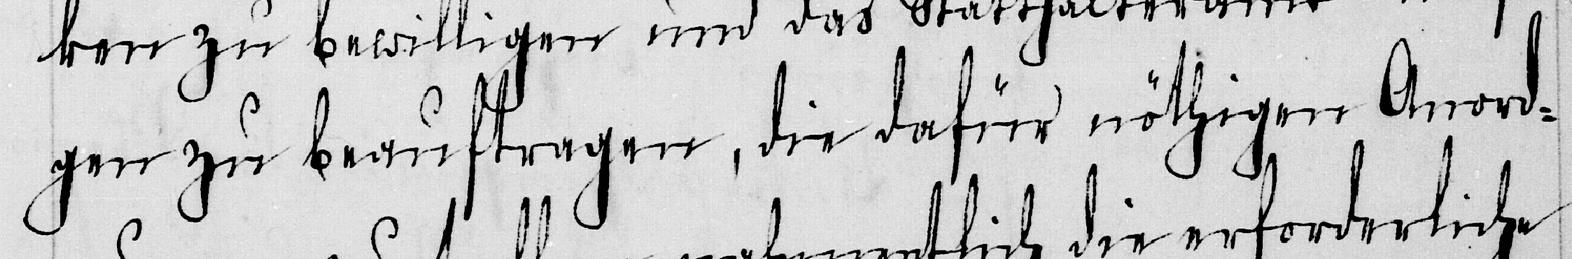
gen zu beauftragen, die dafür nöthigen Anord¬
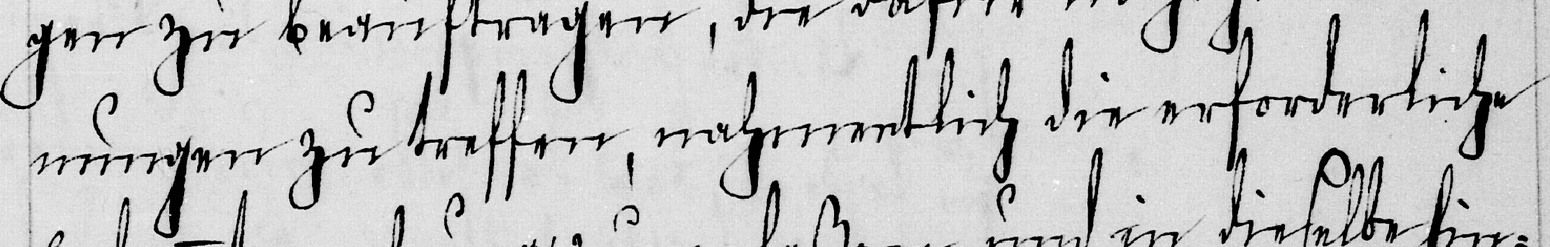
nungen zu treffen, nahmentlich die erforderliche
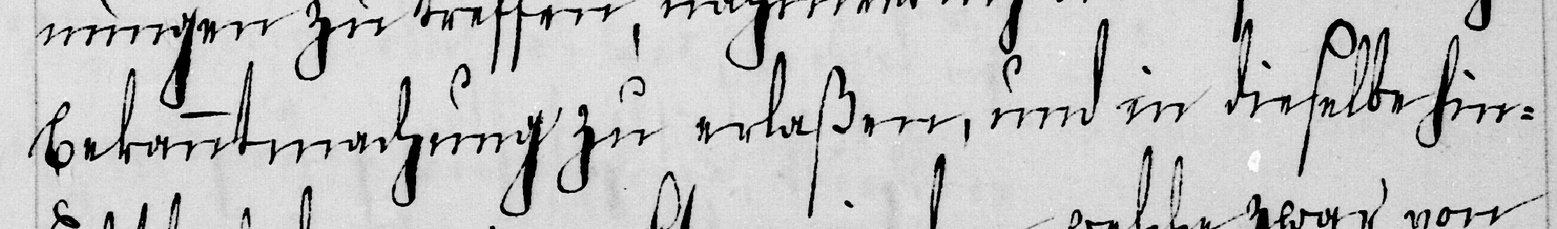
Bekanntmachung zu erlaßen, und in dieselbe hin¬
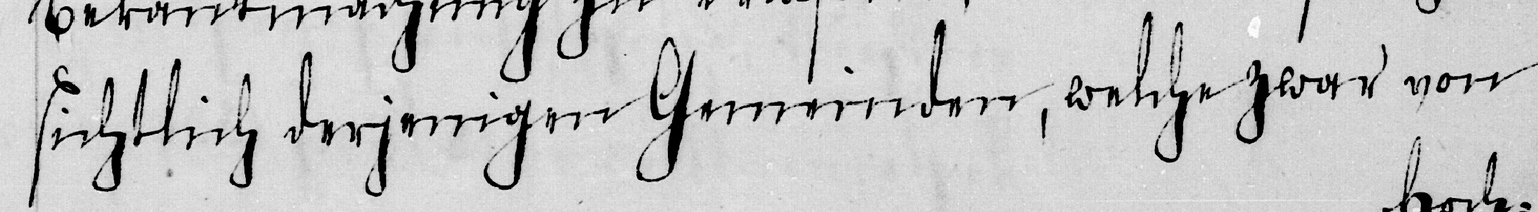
sichtlich derjenigen Gemeinden, welche zwar von
